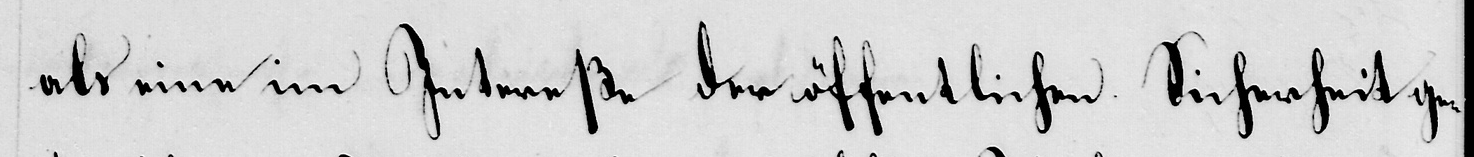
als eine im Intereße der öffentlichen Sicherheit ge¬
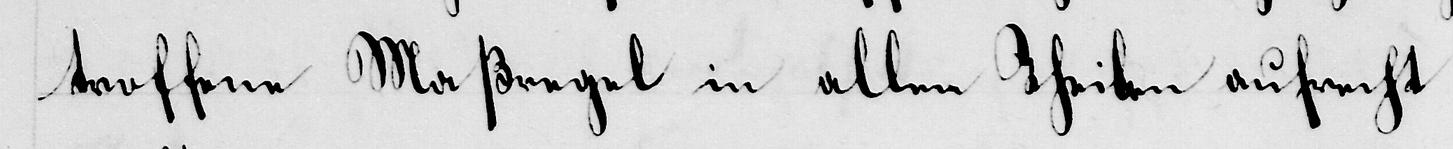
troffene Maßregel in allen Theilen aufrecht
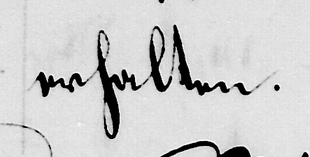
erhalten.
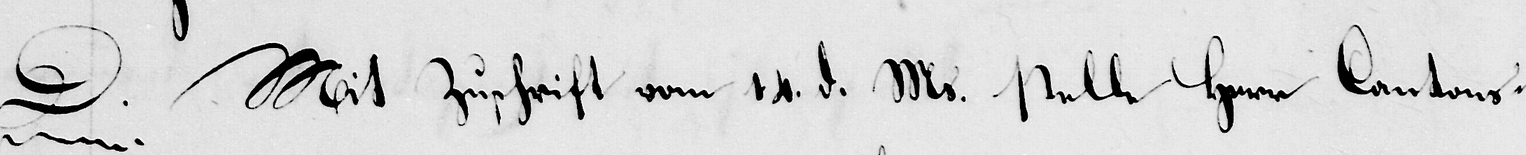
D. Mit Zuschrift vom 14. d. Ms. stelle Herrn Cantons¬
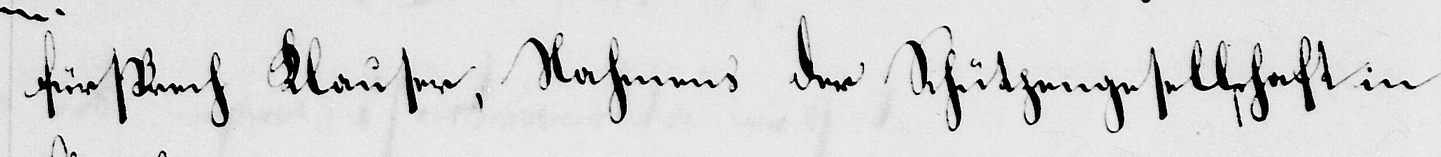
fürsprech Klauser, Nahmens der Schützengesellschaft in
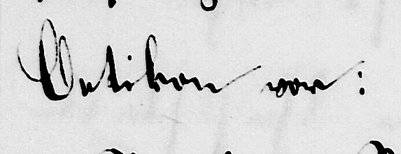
Oetikon vor:
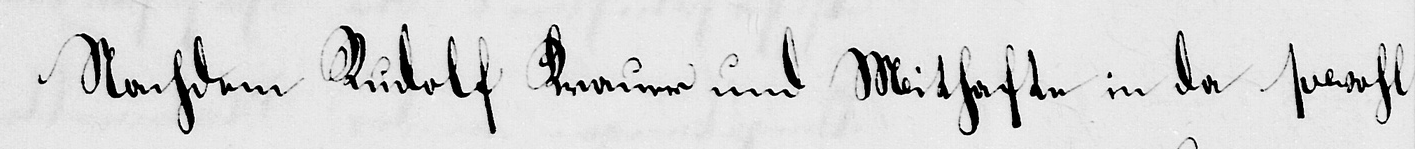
Nachdem Rudolf Krauer und Mithafte in da sowohl
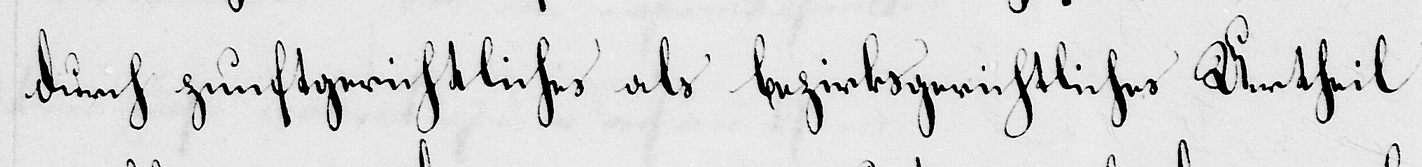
durch zunftgerichtliches als bezirksgerichtliches Urtheil
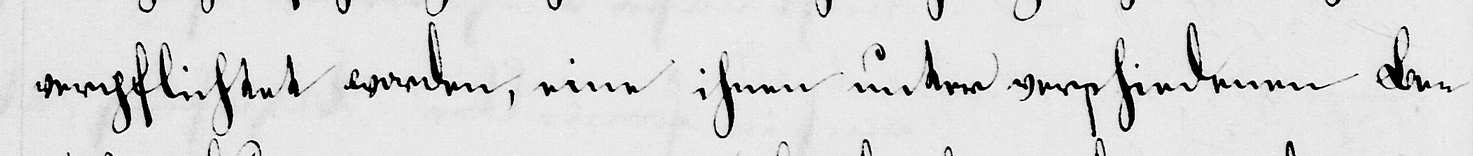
verpflichtet worden, eine ihnen unter verschiedenen Be¬
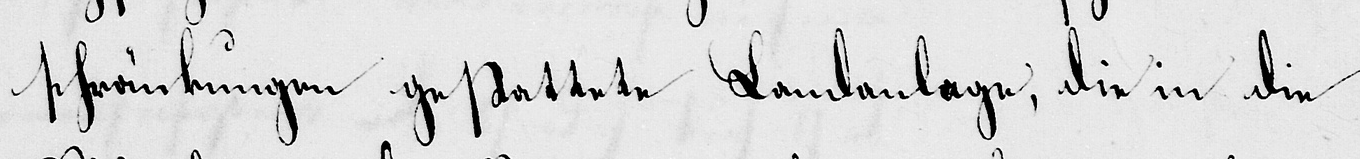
schränkungen gestattete Landanlage, die in die
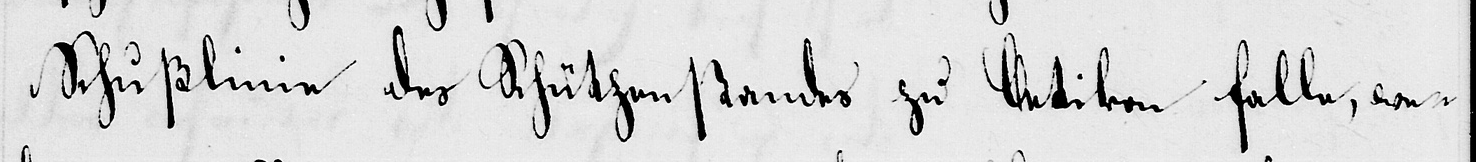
Schußlinie des Schützenstandes zu Oetikon falle, we¬
